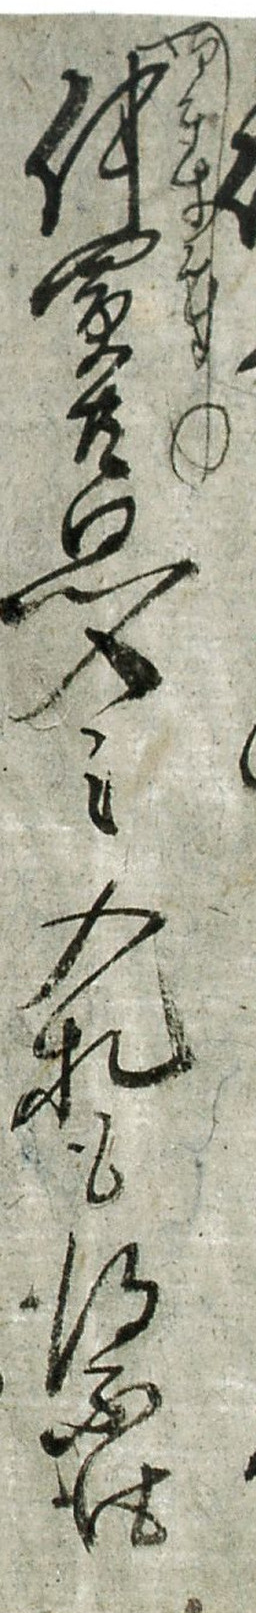仲買共思入之入札も得不仕
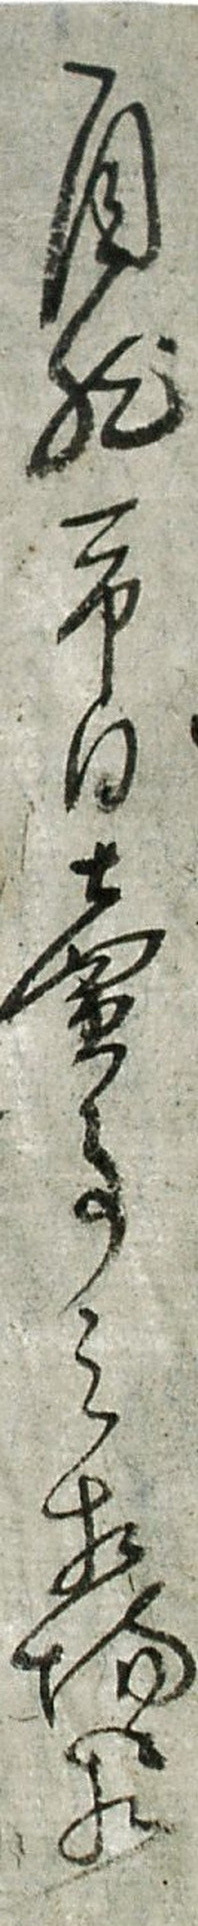自然市日売事之相場に相
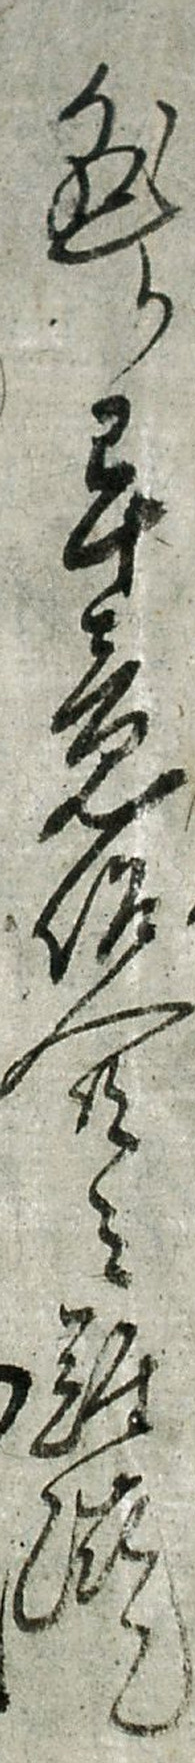懸り畢竟作人共之難渋に
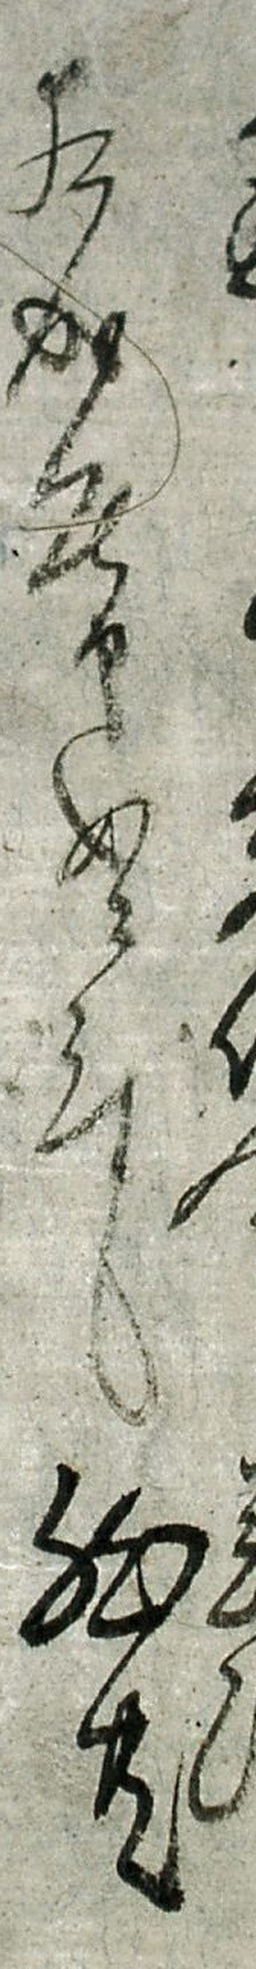相成居申義に御座候然共
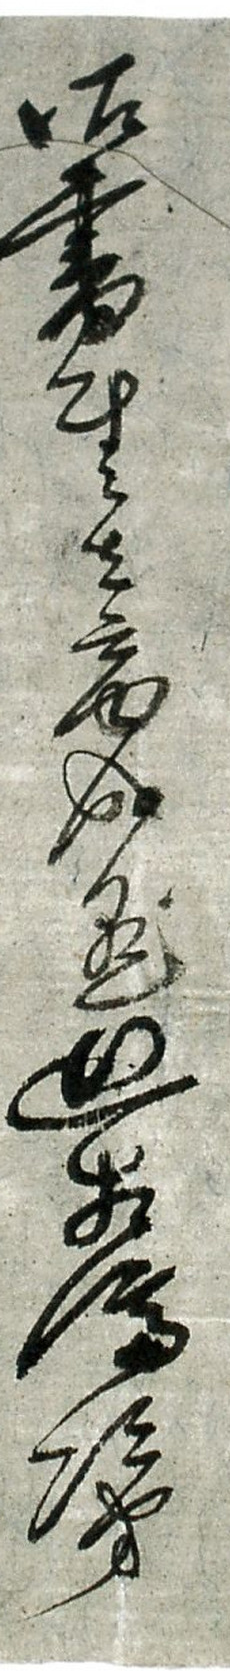御書付には商成懸廻相済次第
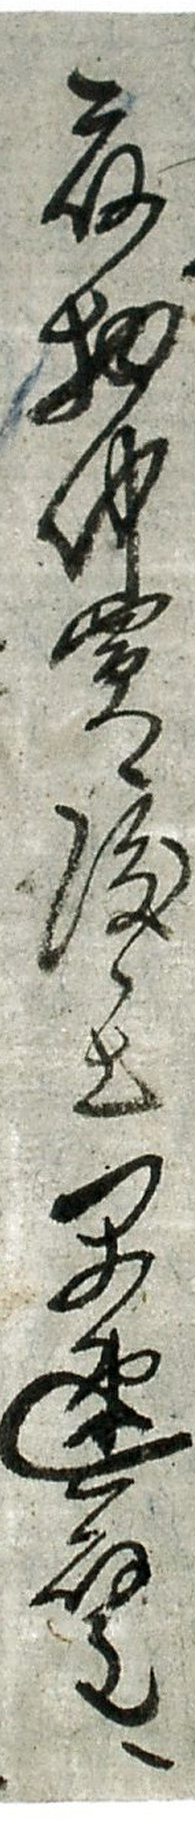荷物仲買へ渡候上早速荷主へ
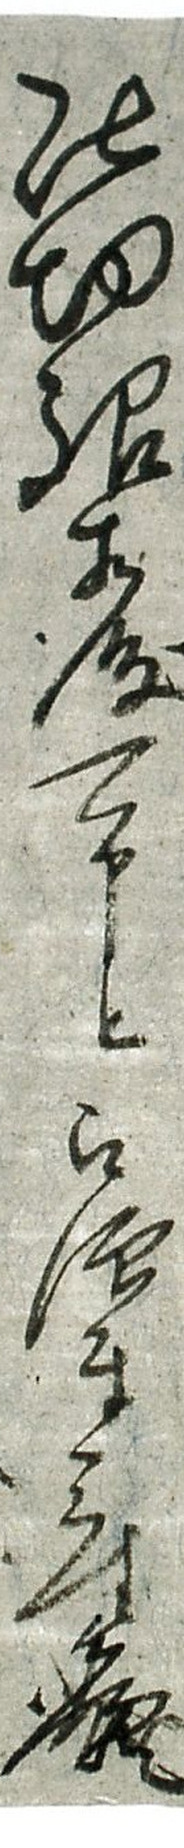仕切銀相渡可申と被仰付御座候得共
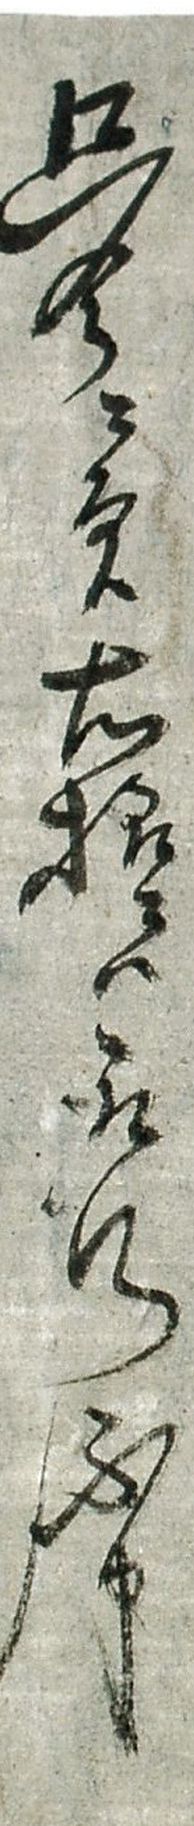只今にては右様には取行不申
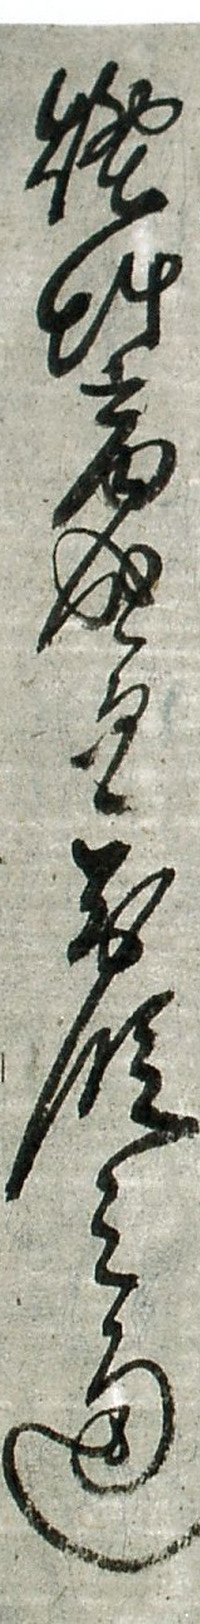煙草商成候ても前段之通
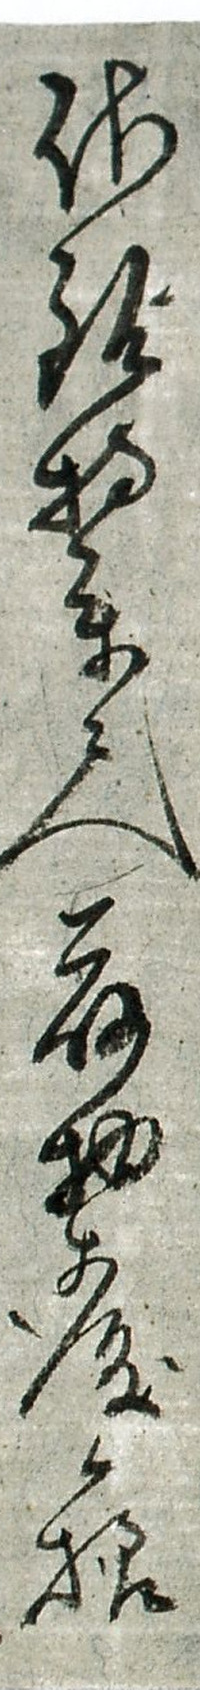代銀持参尺荷物相渡候様
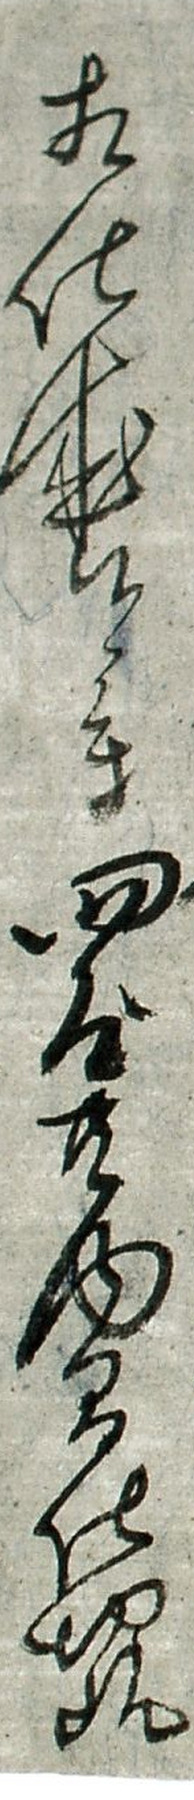相仕成候に付問屋共内間仕切銀
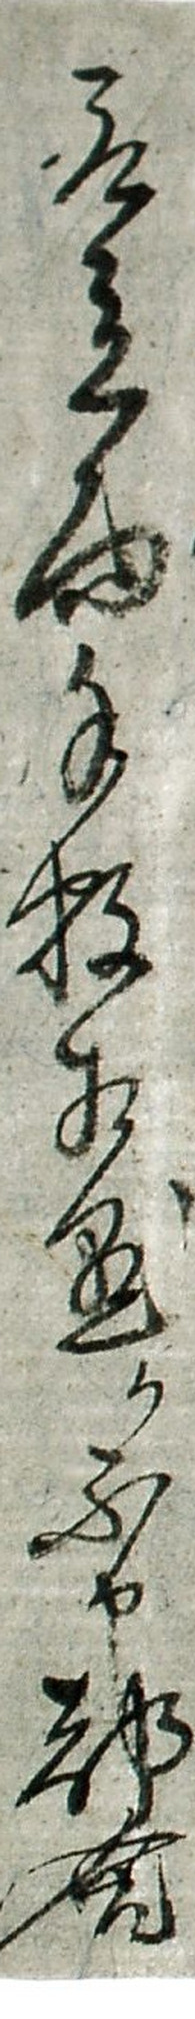取立向手数相懸り不申都合
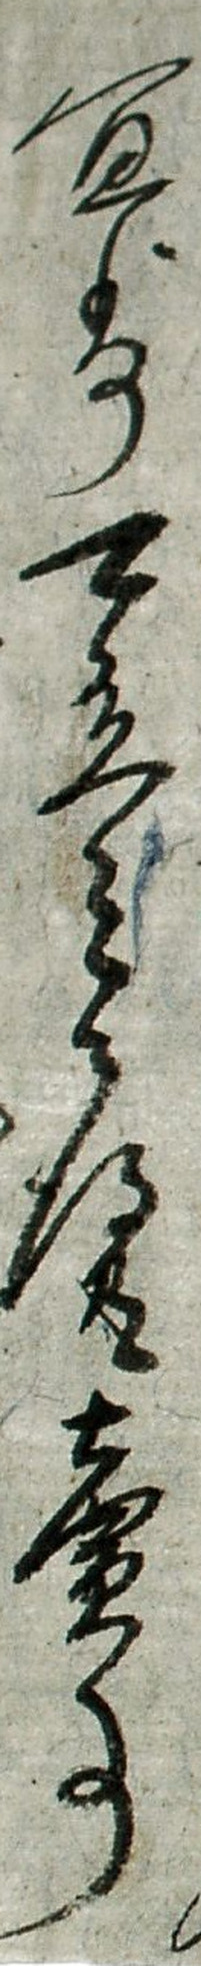宜布可有之候得共売事
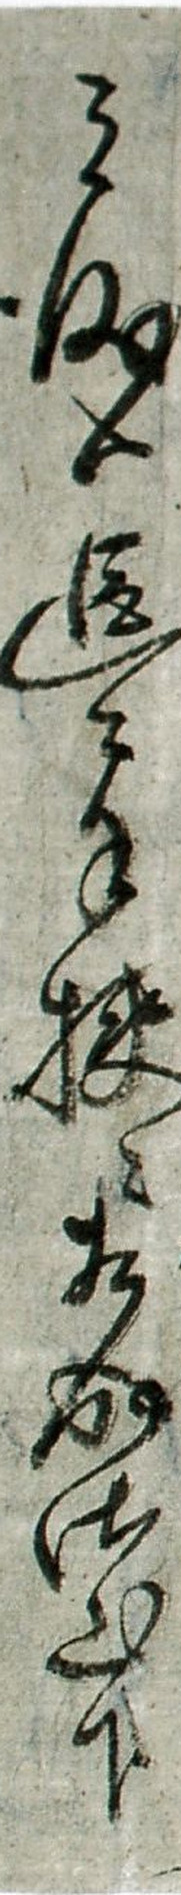之儀は追々手狭に相成御山下
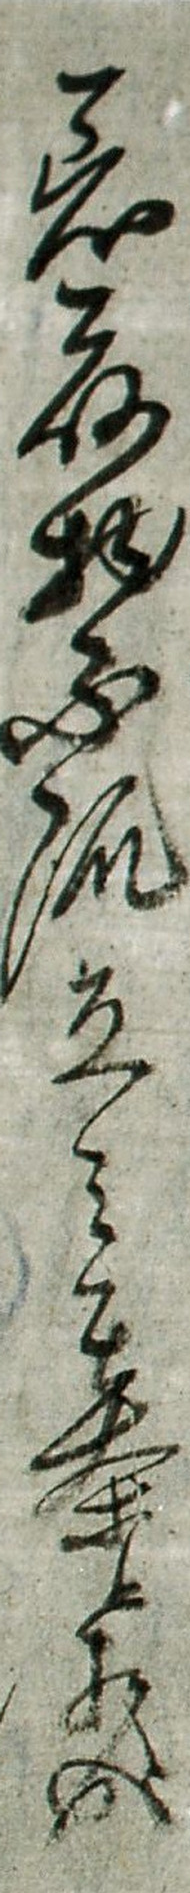着荷物不派立之奏に相成
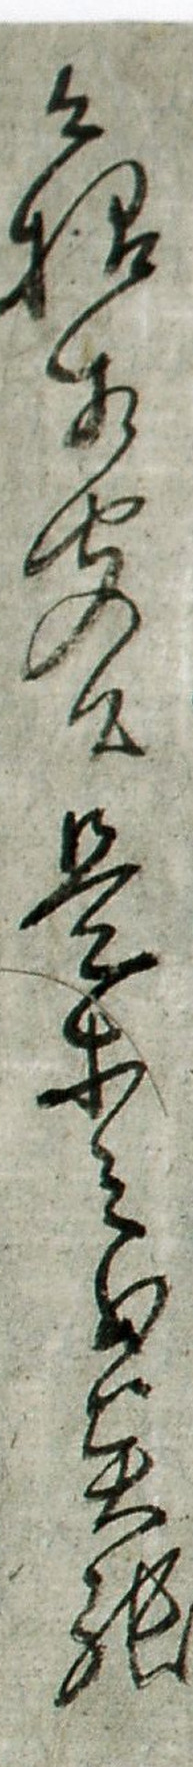候様相聞候是等之義は矢張
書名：(美馬三好両郡百姓共煙草問屋壱手勘定ニ相成迷惑願右始末承申上書付之写）
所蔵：鳴門教育大学 Naruto University of Education
